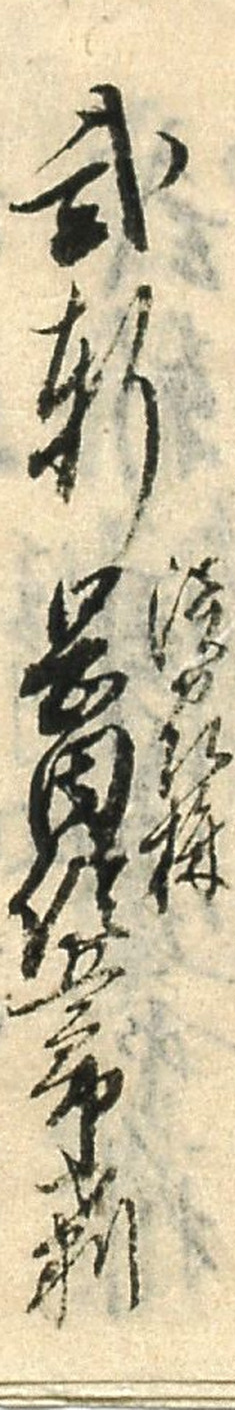弐軒岡田佐五郎才判
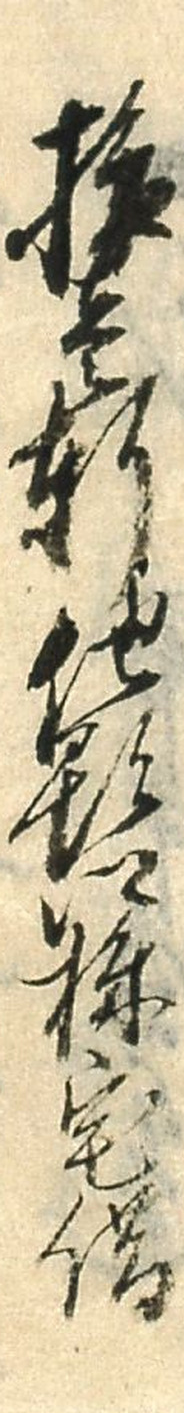拾壱軒他郡郷株宅借
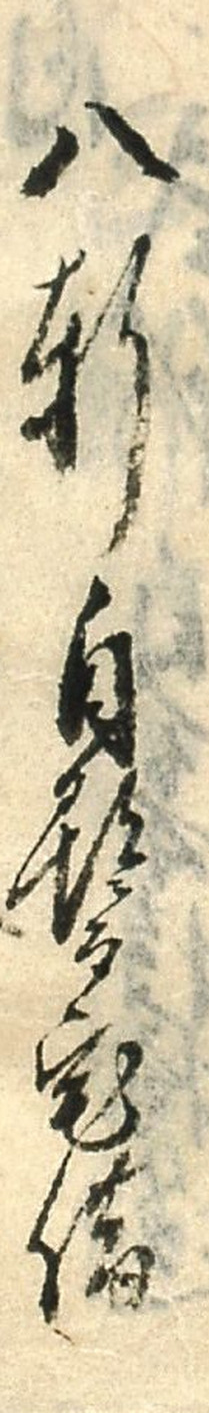八軒自郡に而宅借
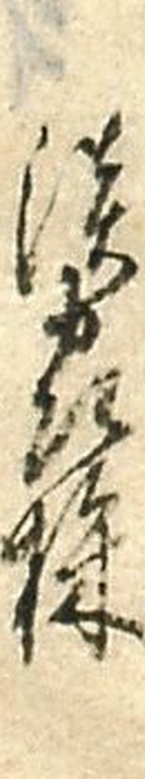淡州株
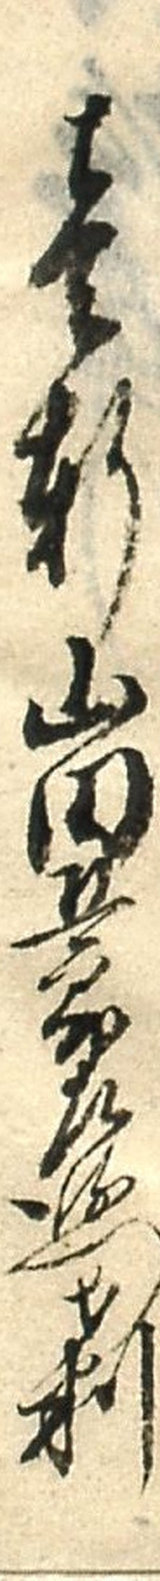壱軒山田五郎左衛門才判
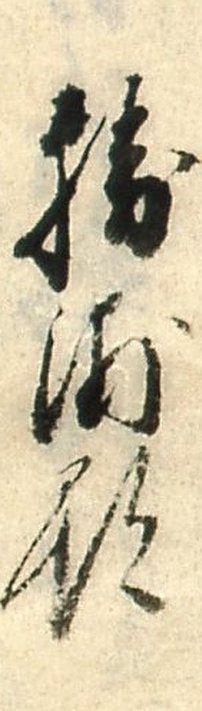勝浦郡
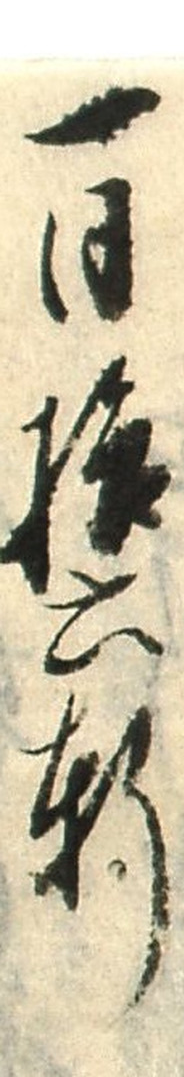一同拾六軒
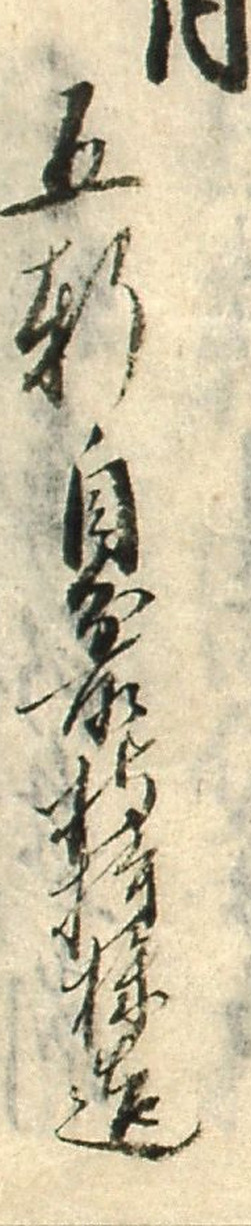五軒自分所持持株造
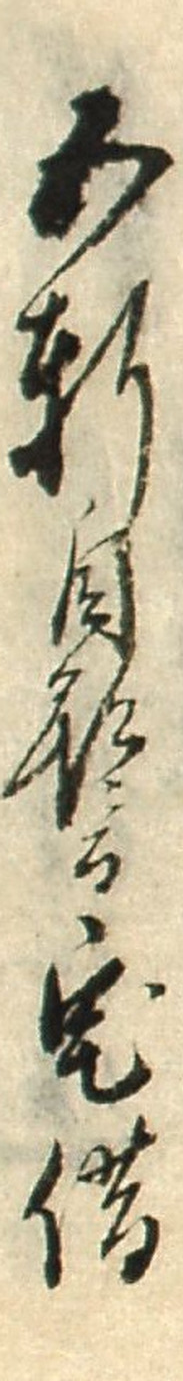五軒自郡に而宅借
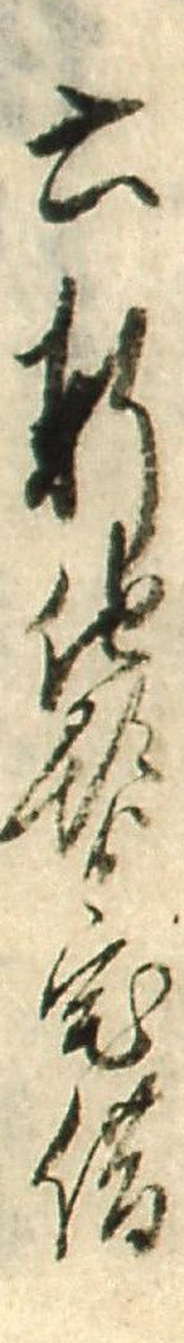六軒他郡ゟ宅借
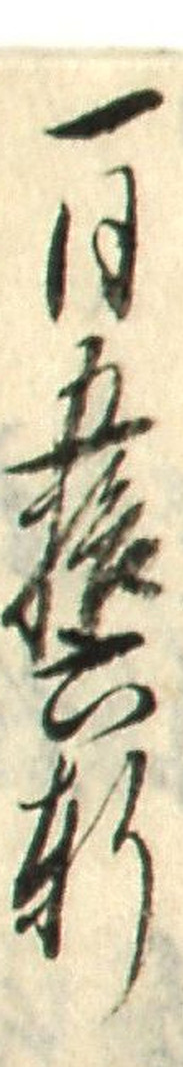一同拾六軒
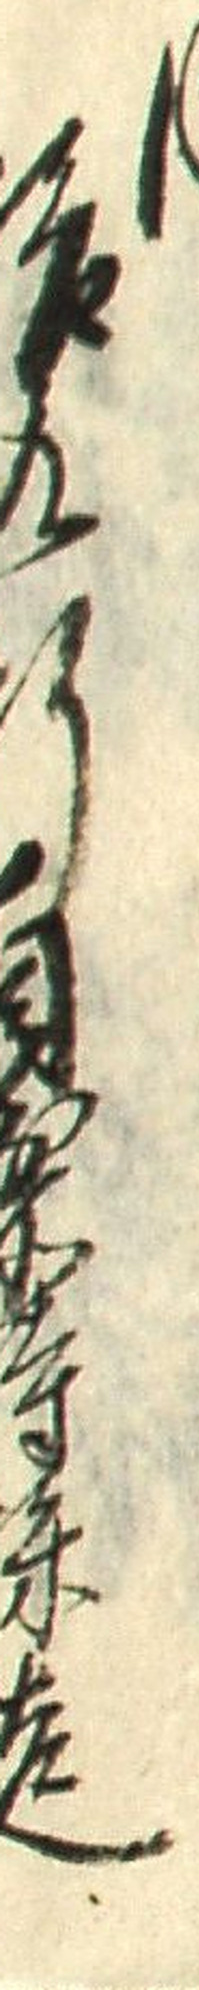六軒自分所持株造

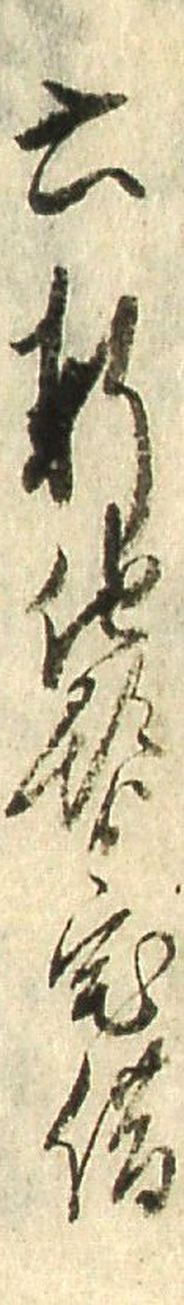拾軒他郡ゟ宅借
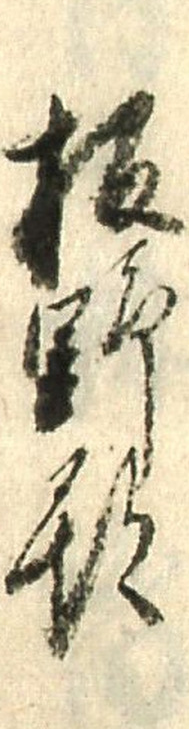板野郡
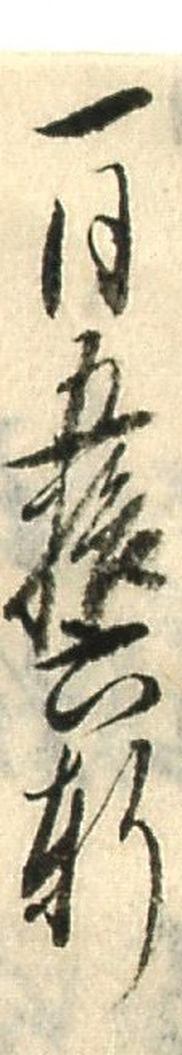一同五拾六軒
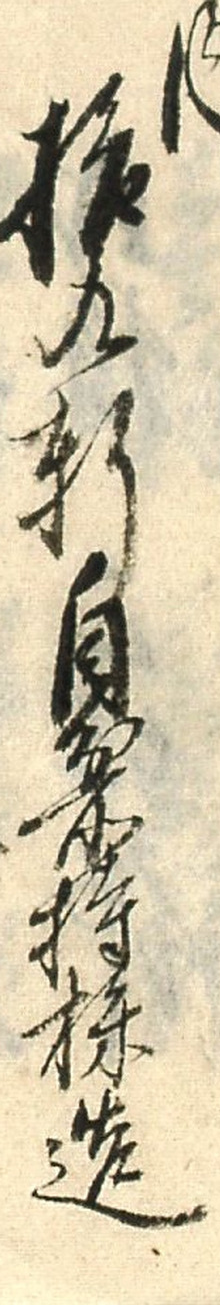拾九軒自分所持株造
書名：南北拾郡造酒屋数並株数調子帳
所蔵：鳴門教育大学 Naruto University of Education
